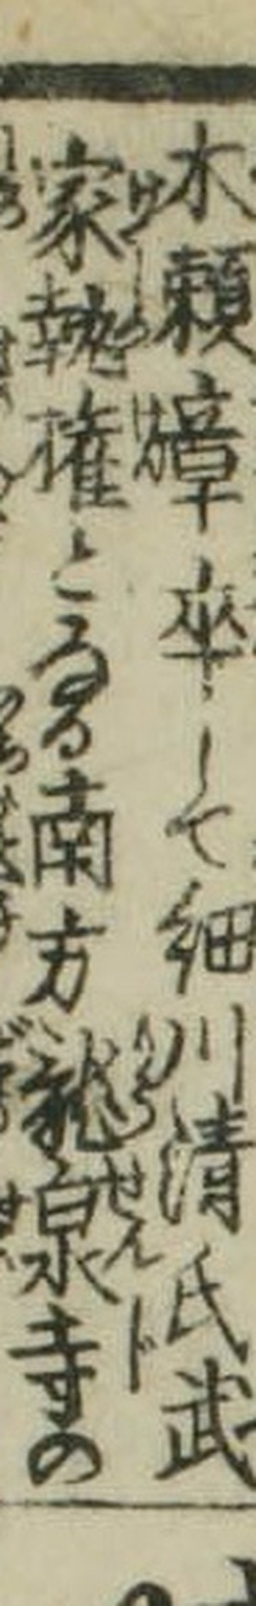家執権となる南方龍泉寺の
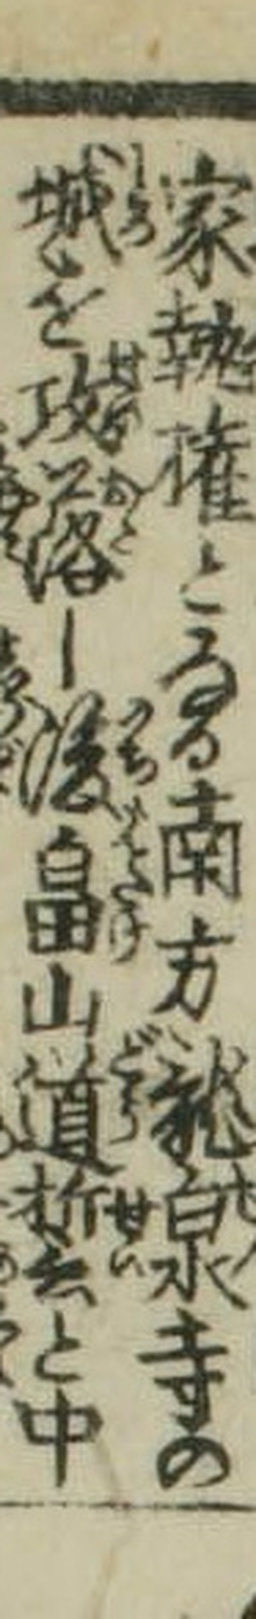城を攻落し後畠山道誓と中
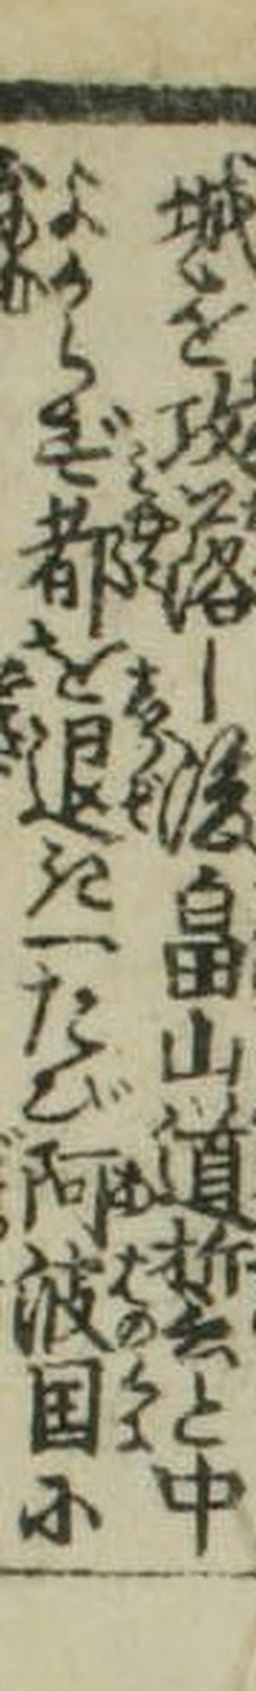よからず都を退き一たび阿波国に
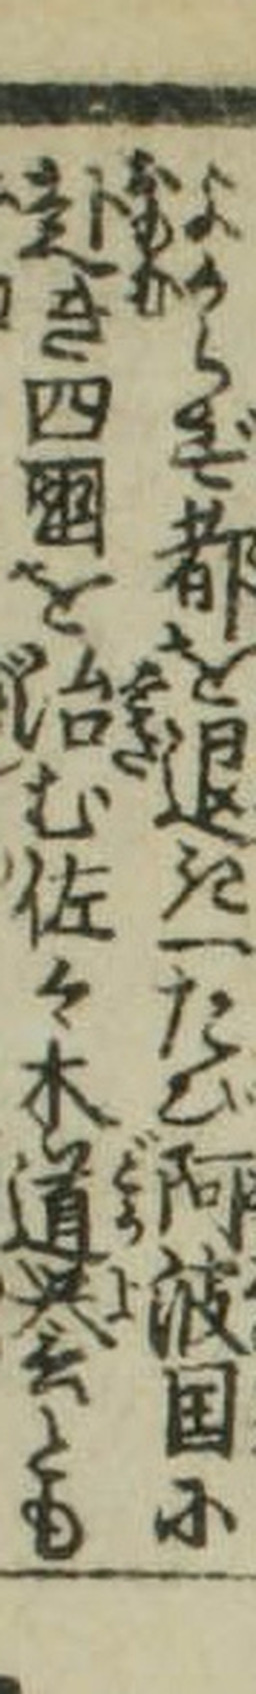赴き四国を治む佐々木道誉とも
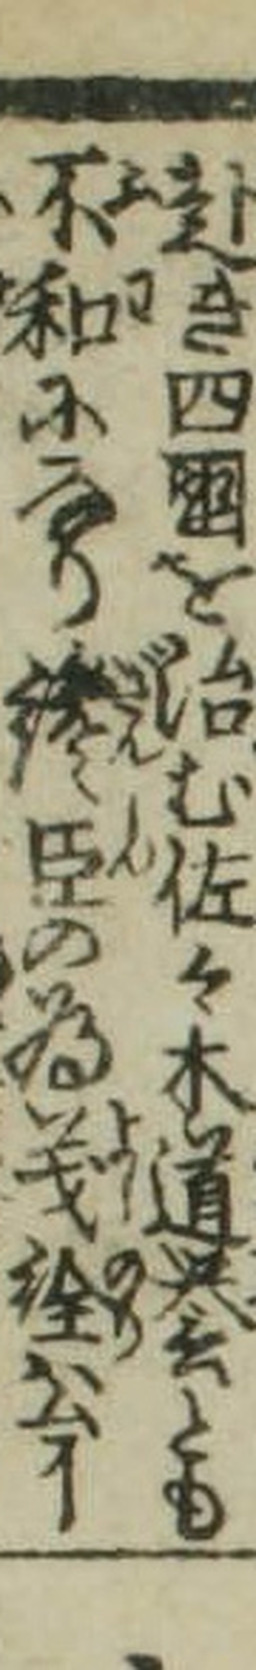不和になり讒臣の為義詮公に
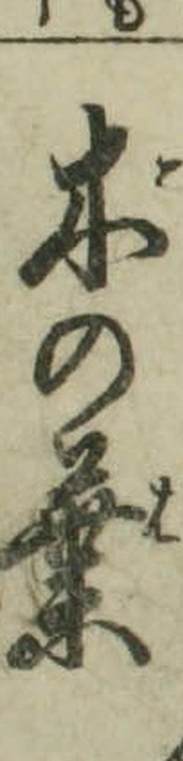木の葉
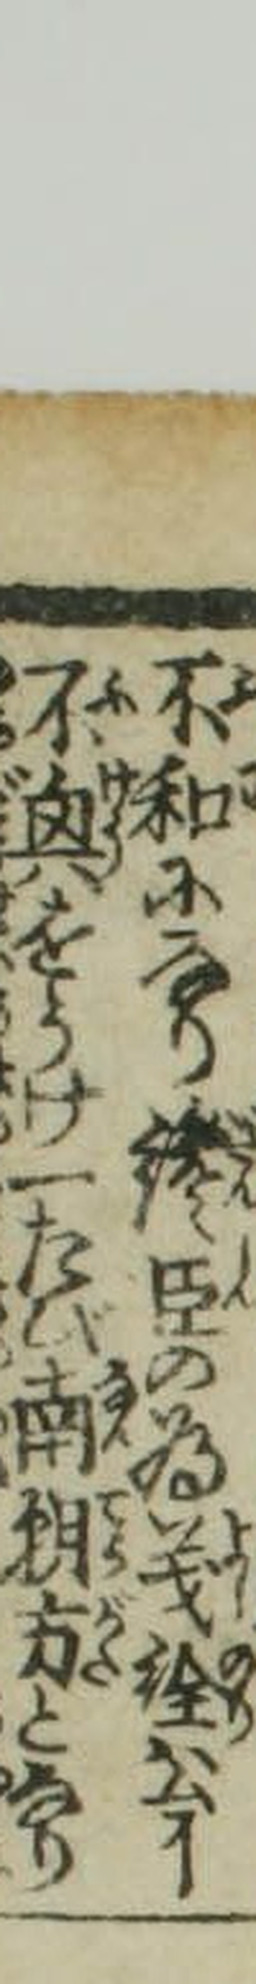不興をうけ一たび南朝方となり
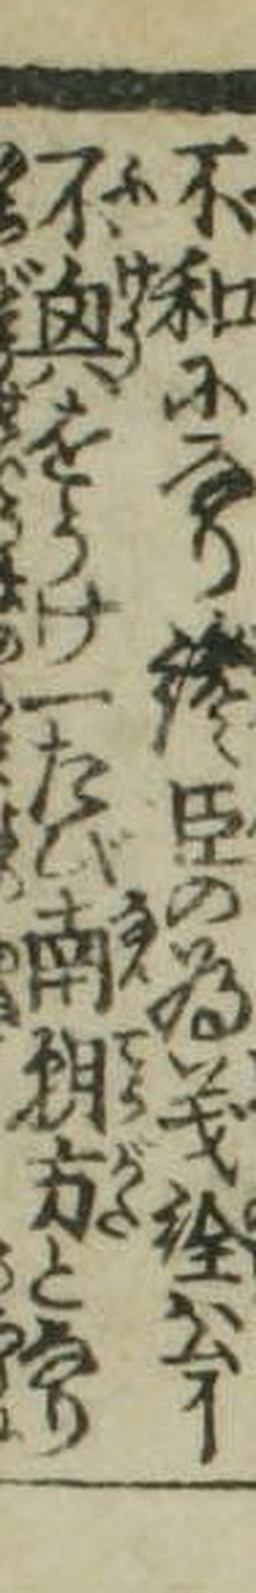不興をうけ一たび南朝方となり
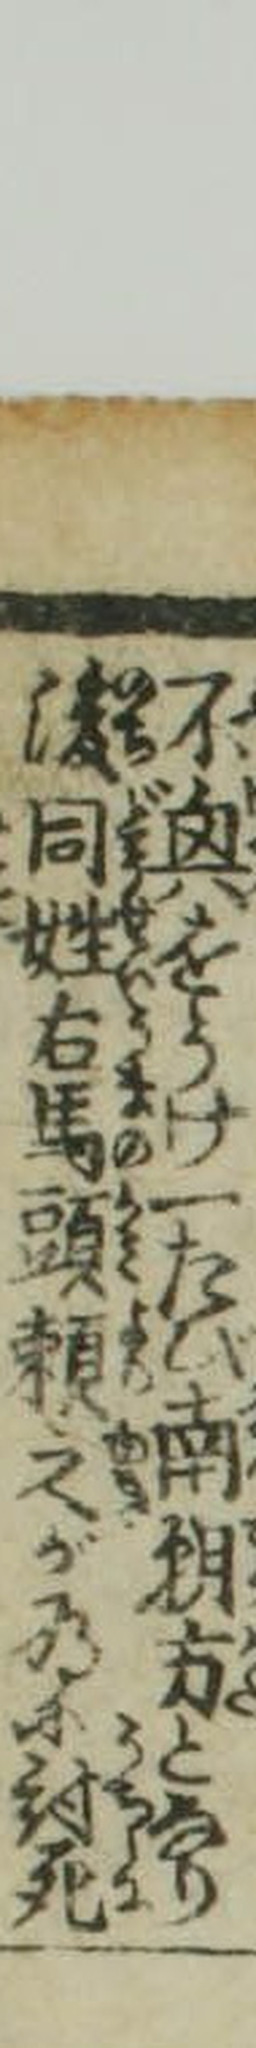後同姓右馬頭頼之が為に討死
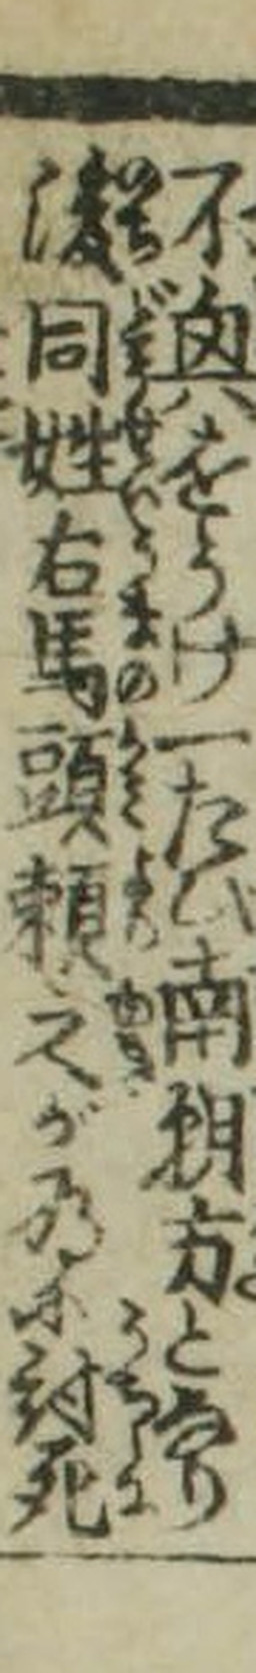後同姓右馬頭頼之が為に討死
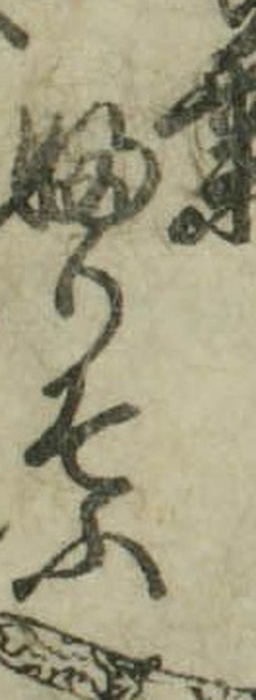ふりそふ
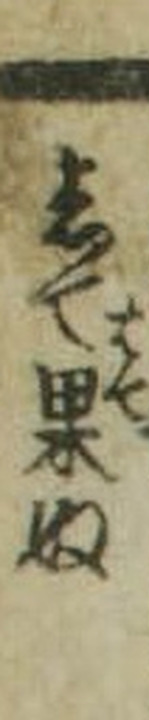して果ぬ
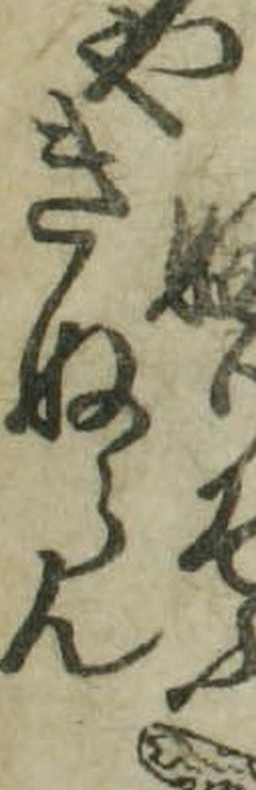きぬらん

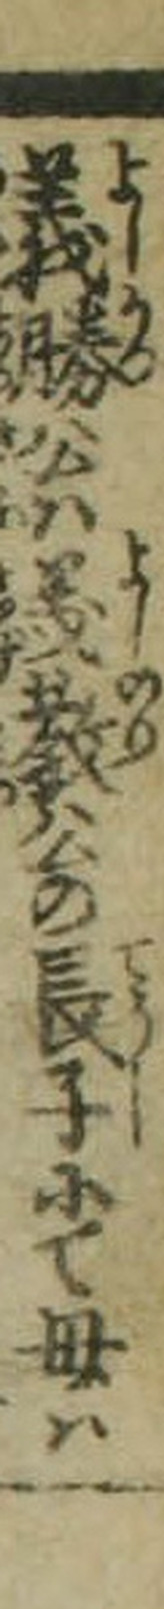義勝公は義教公の長子にて母は
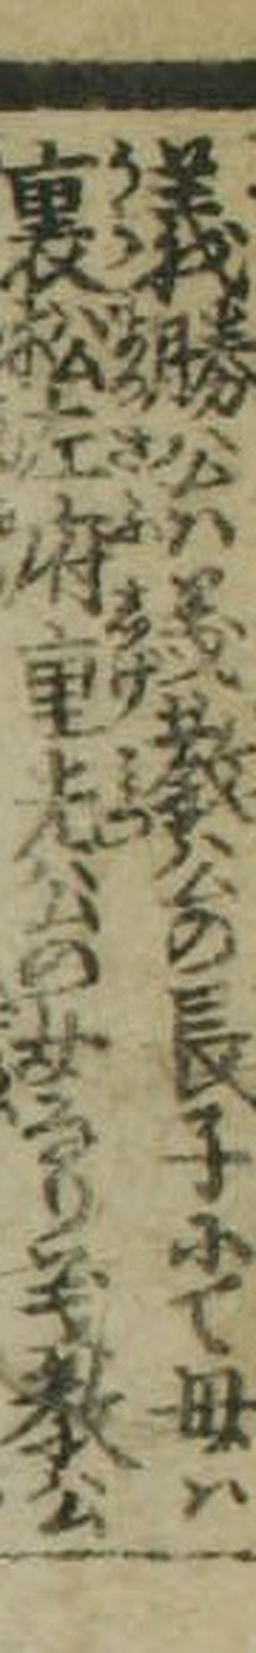裏松左府重光公の女なり義教公
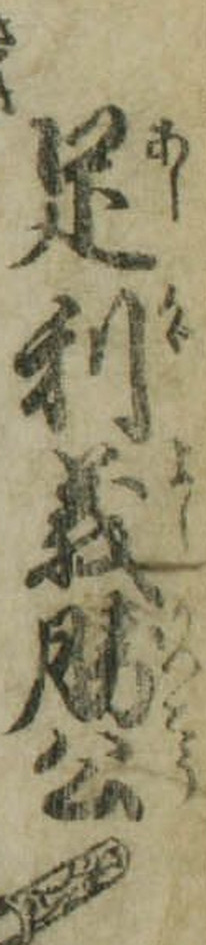足利義勝公
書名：續英雄百人一首
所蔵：東京学芸大学附属図書館
